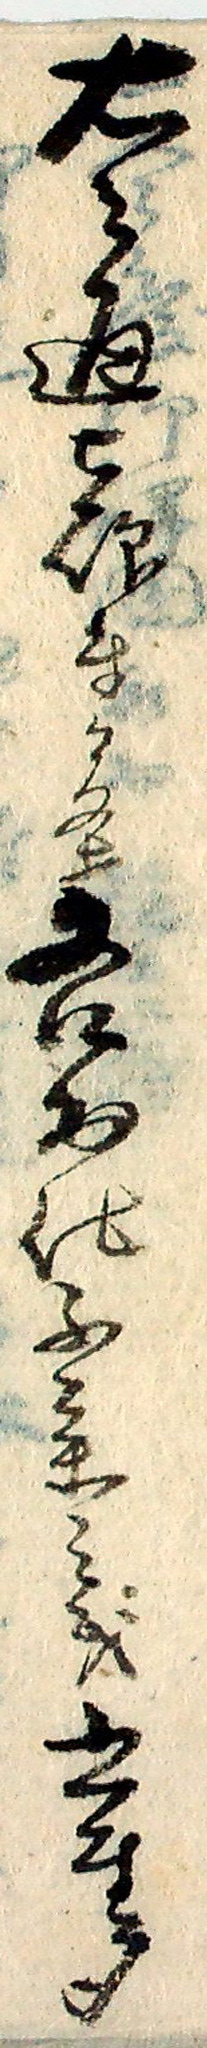右之通被仰付候条各出仕不参之義書付にして
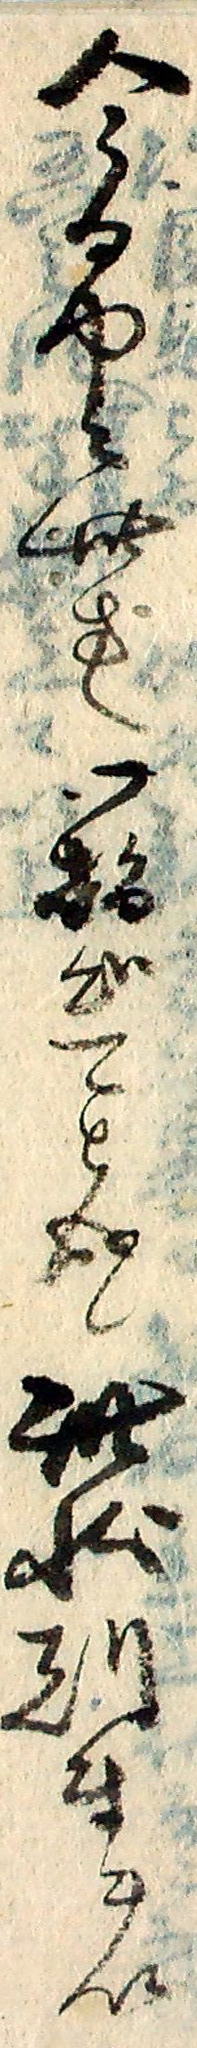今日中に此方へ御指出可被成候此状刻付を以
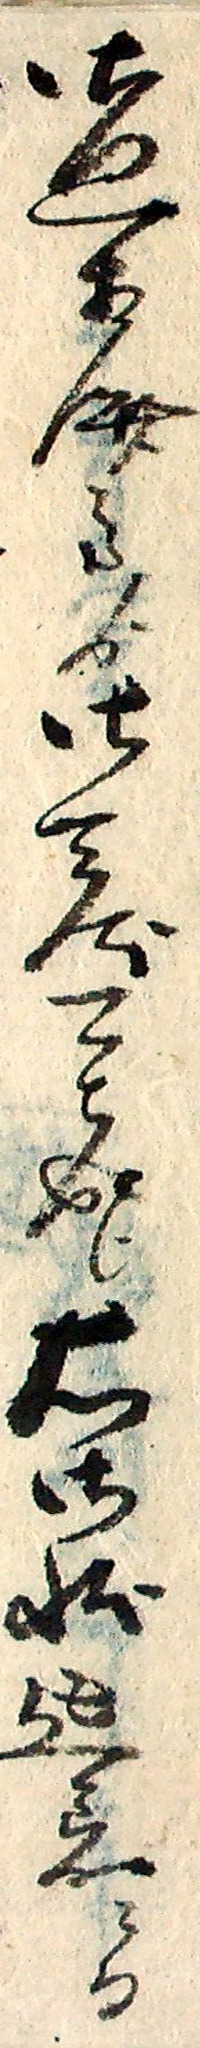御廻相済方ゟ御戻可被成候右御状延着にて
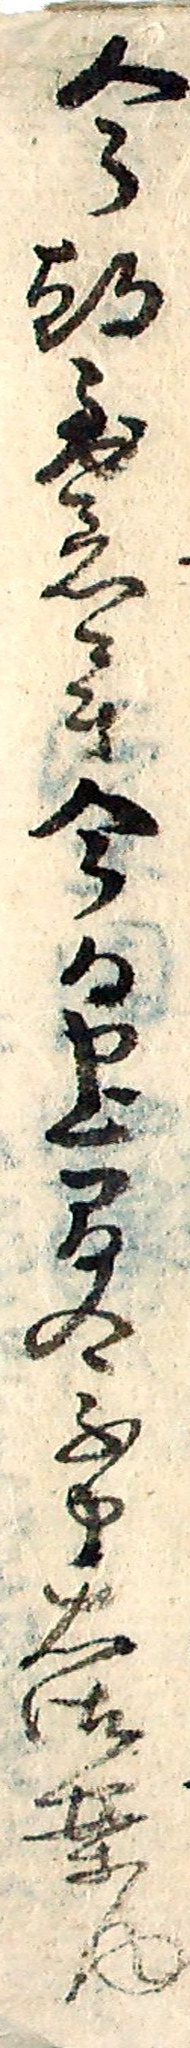今朝到着に付今日申上間合不申右御案内

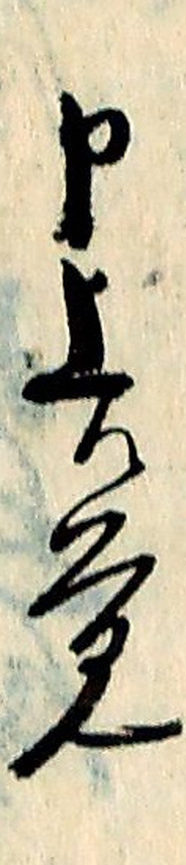申上る覚
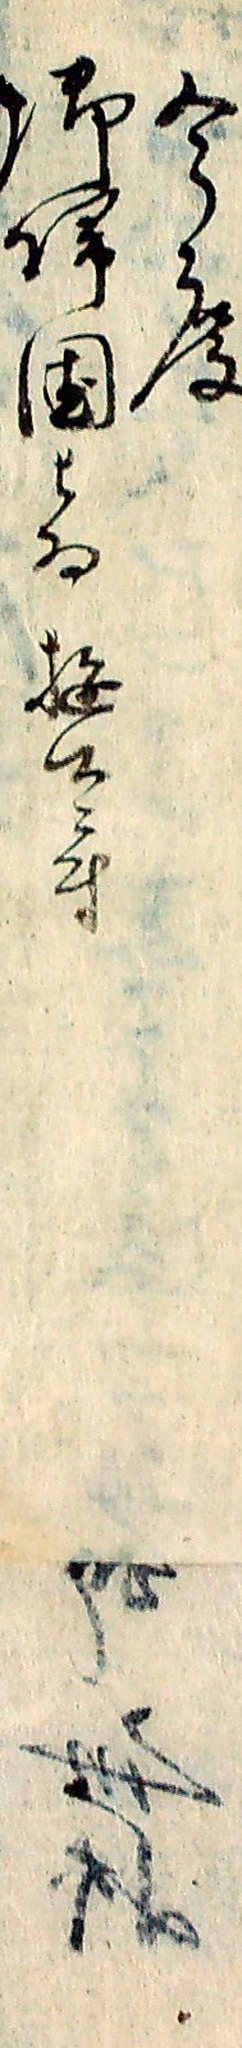御帰国被為遊候に付
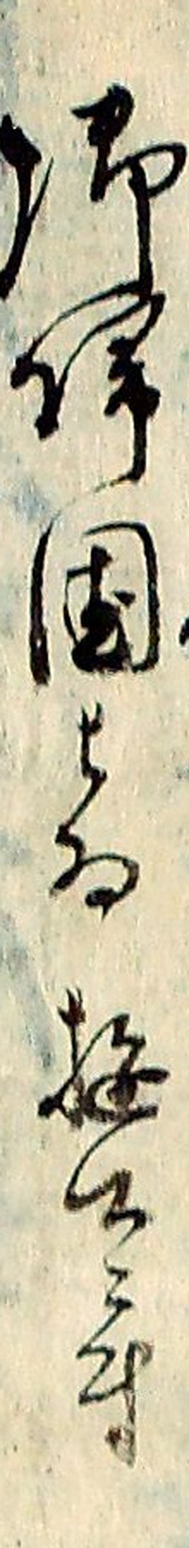御帰国被為遊候に付
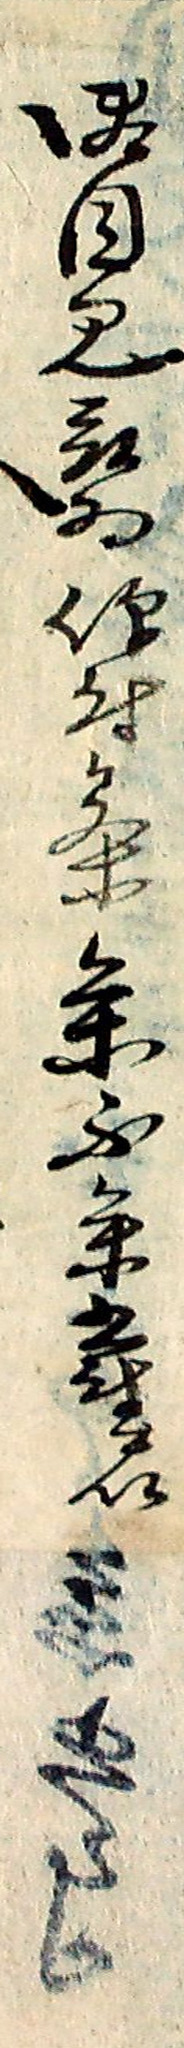御目見被為仰付候条参不参書付を以
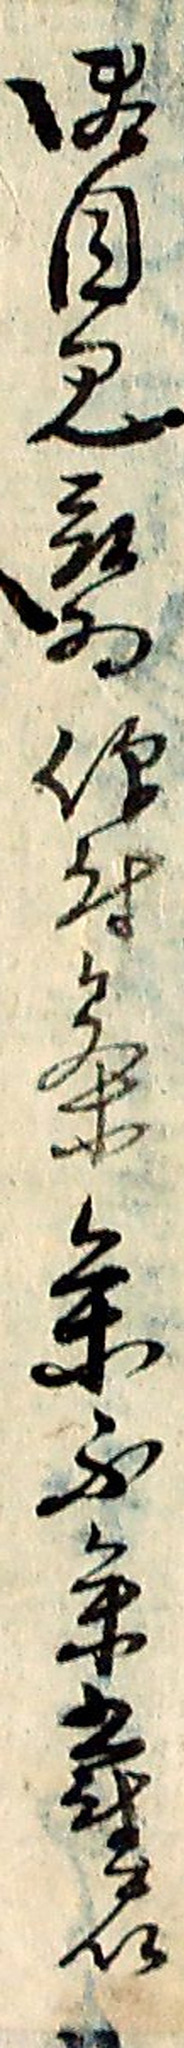御目見被為仰付候条参不参書付を以
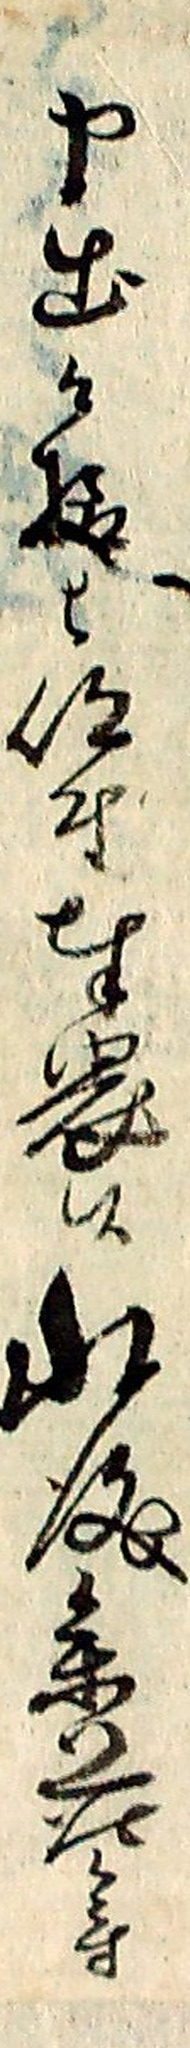申出候様被仰付奉畏候私儀参上仕候付
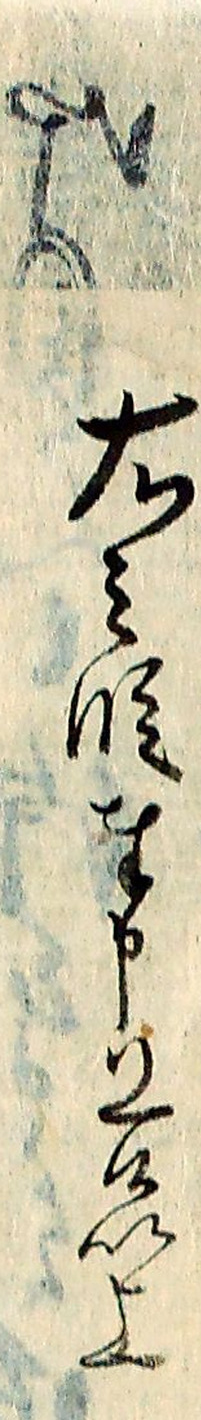右之段奉申上候以上
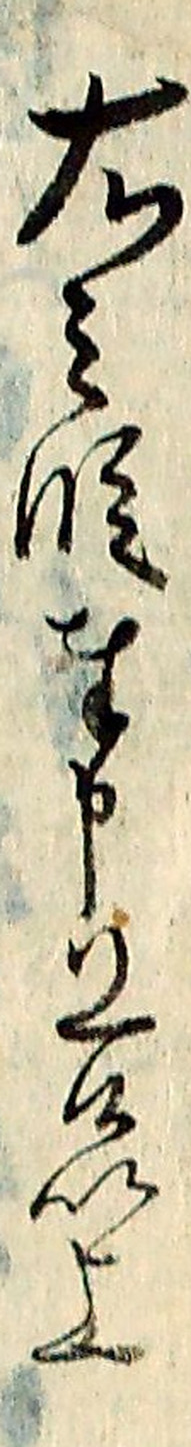右之段奉申上候以上
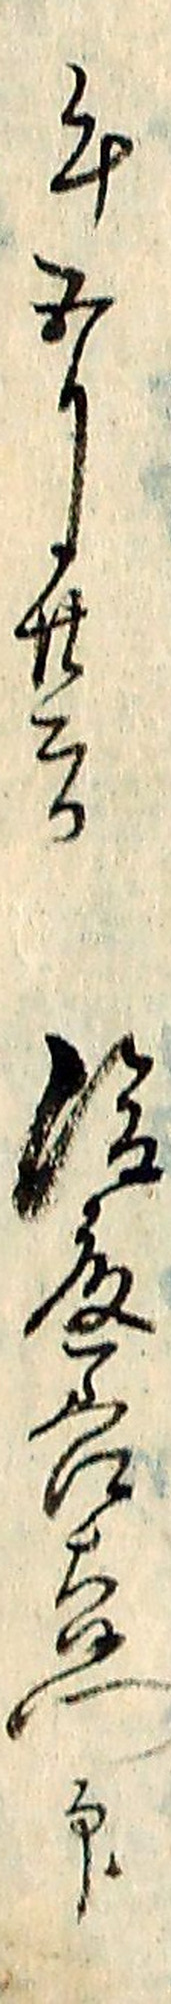午五月廿二日後藤善右衛門印
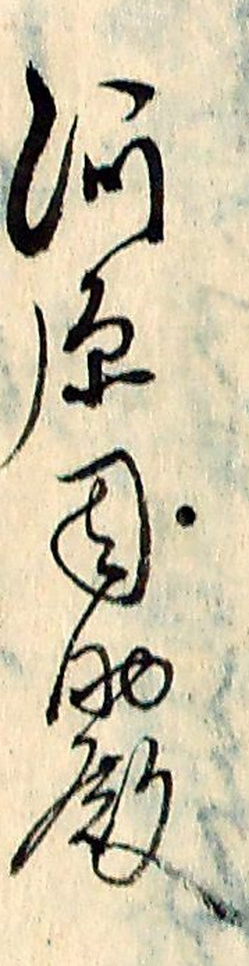河原周助殿

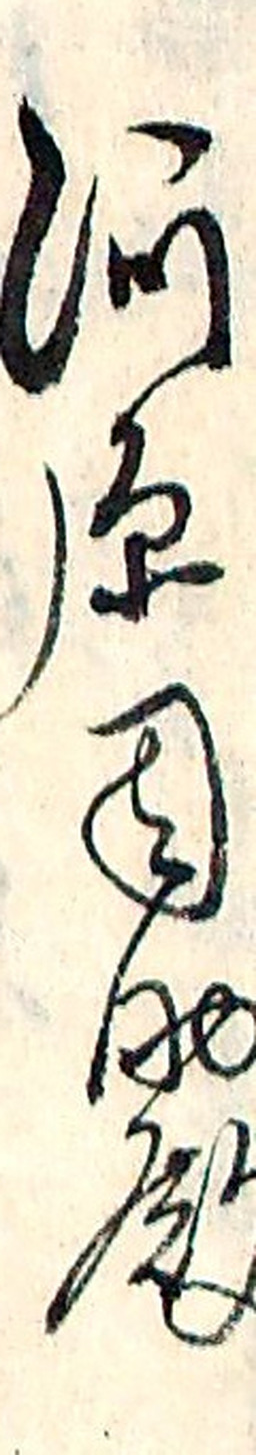河原周助殿
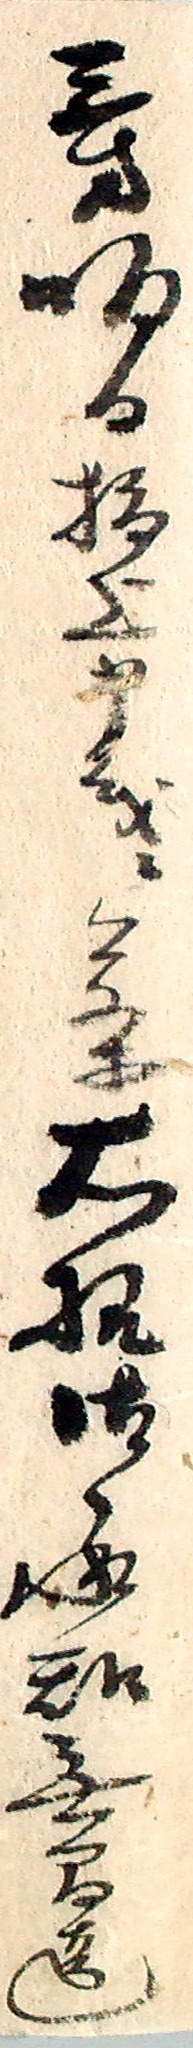旁明日指上申義に候条右様御承知無間違
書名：諸御願書控(後藤氏壱番）
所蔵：鳴門教育大学 Naruto University of Education
